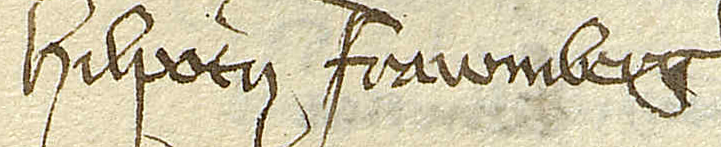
Hilpoltn* Frawmberg*
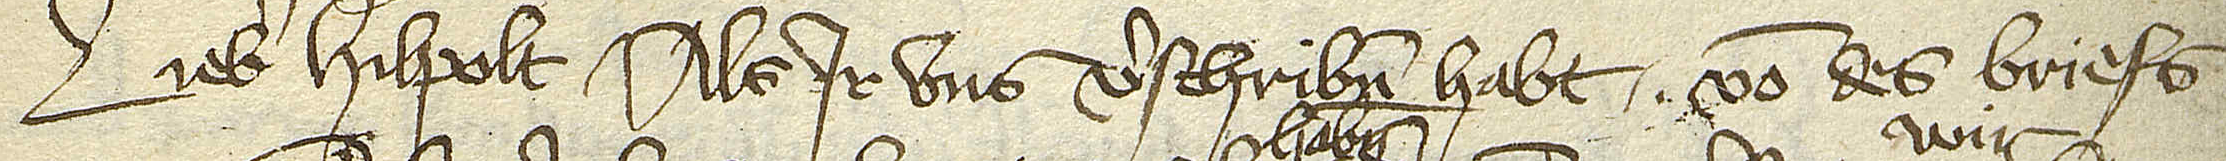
Lieb* Hilpolt / Als Ir vns v*ſchribn* habt / . vo* des briefs
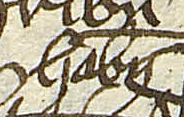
habn*
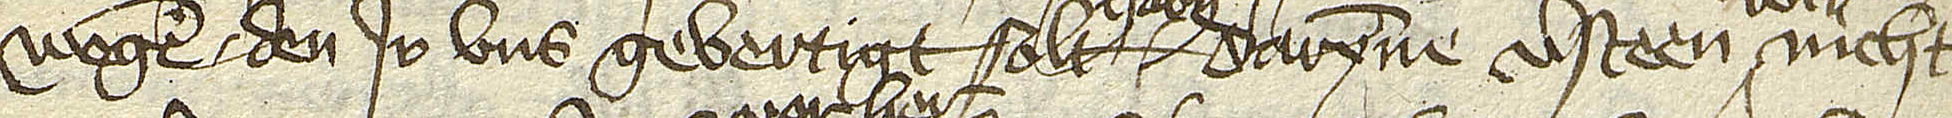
wege* / den Ir vns gevertigt ſolt / Daryne* v*ſteen nicht
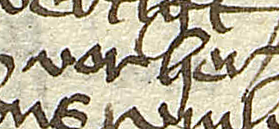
vor her
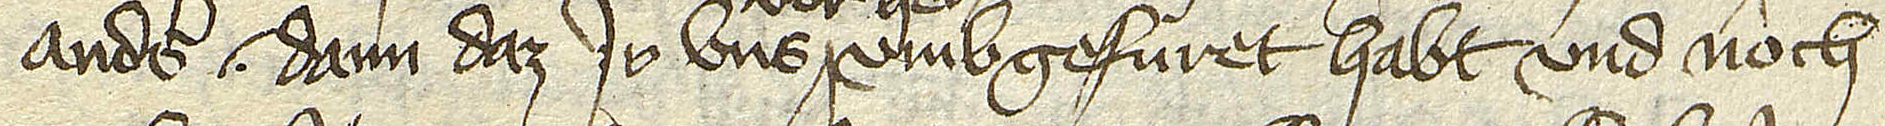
ands* / . dann daʒ Ir vns vmb gefüret habt vnd noch
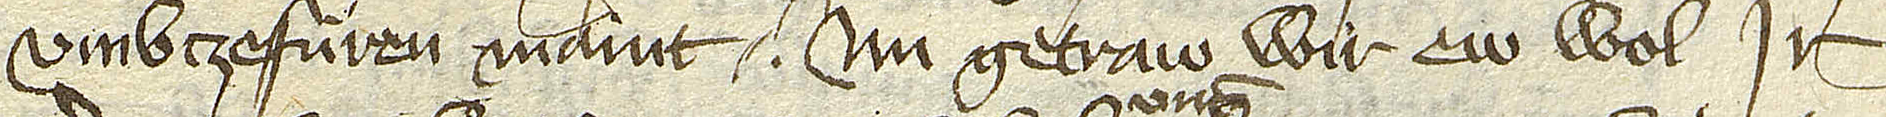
vmbcʒefüren maint / . Nu getraw wir ew wol Ir
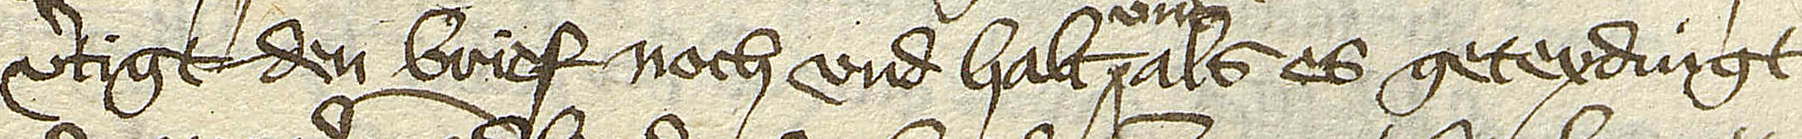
v*tigt den brief noch vnd halt als es geteydingt
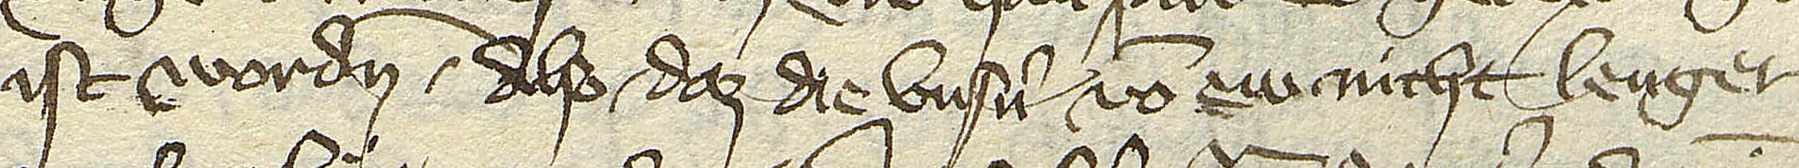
iſt wordn* / Alſo / daʒ die vnſn* vo* ew nicht lenger
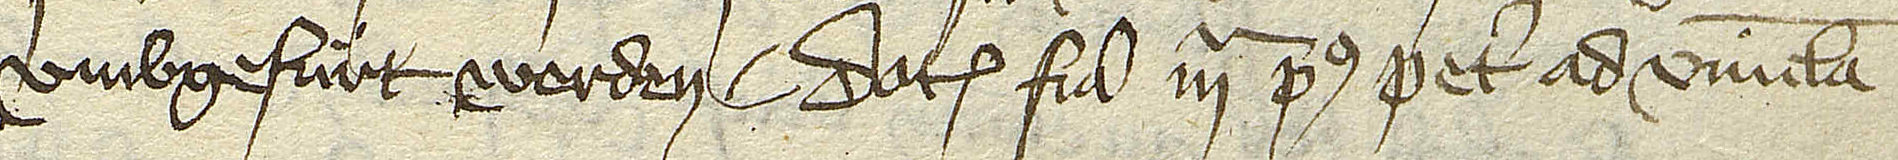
vmbgefürt werden / Dat* fia* iii* p* pet* ad vincla*
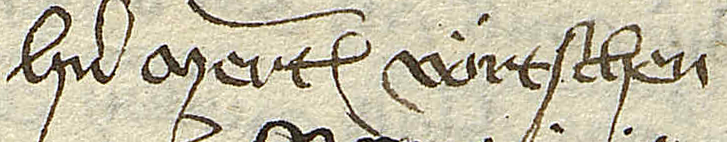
hn* Mert* vörtſchen
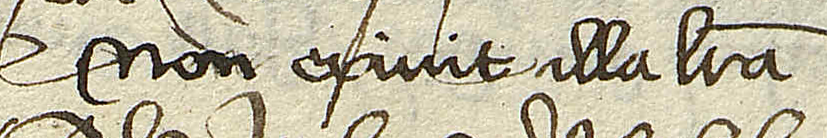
non exiuit illa lra*
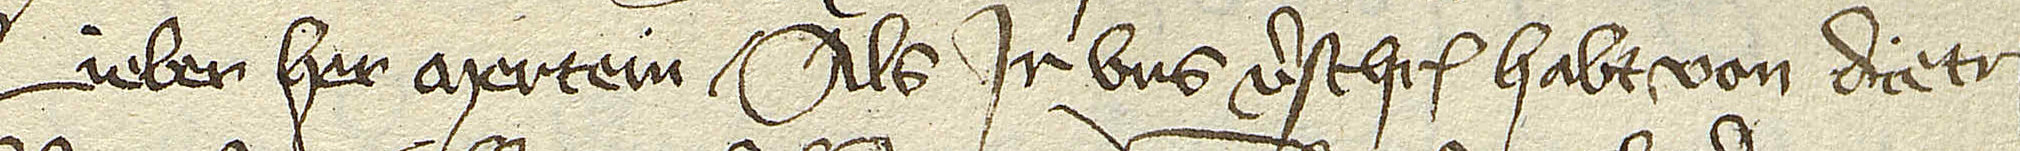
Lieber her Mertein / Als Ir vns v*ſchr* habt von dietr*
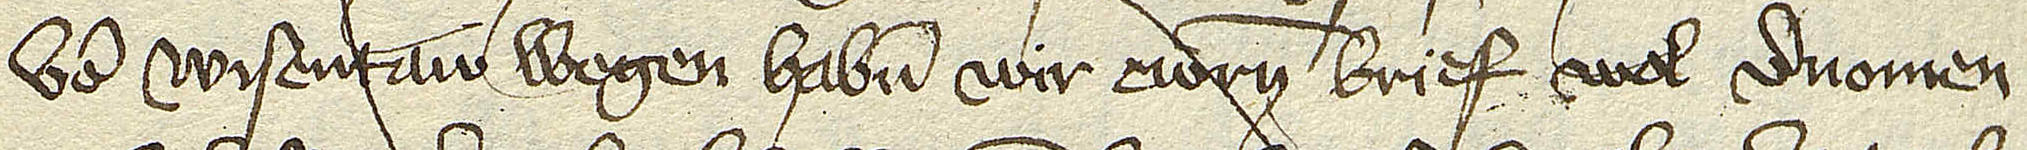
vo* wiſentaw wegen habn* wir ewrn* brief wol v*nomen
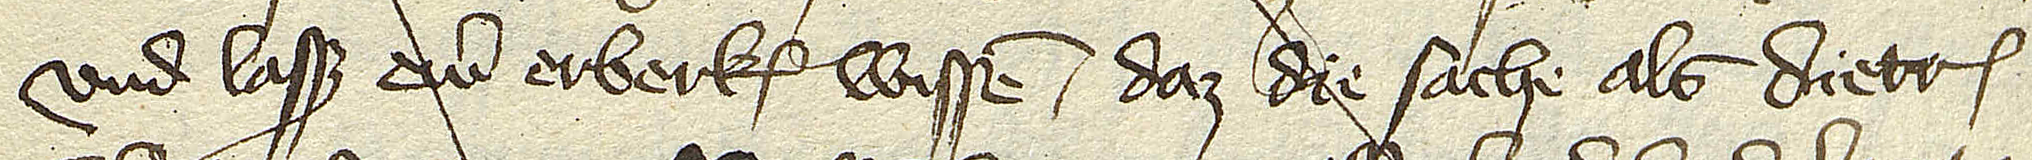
vnd laſſ* ew* erberk* wiſſe* / daʒ die ſache als dietr*
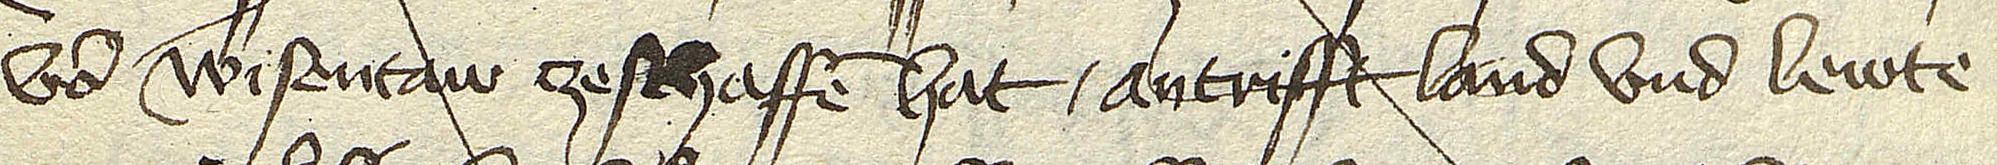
vo* wiſentaw cʒeſchaffe* hat / antrifft land vnd lewte
